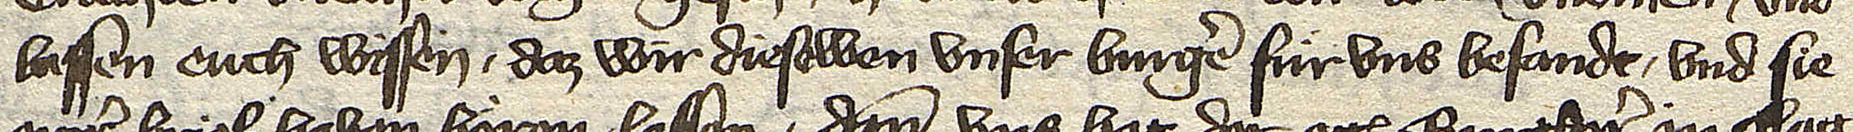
laſſen euch wiſſen / daʒ wir dieſelben vnſer burge* für vns beſandt / vnd ſie
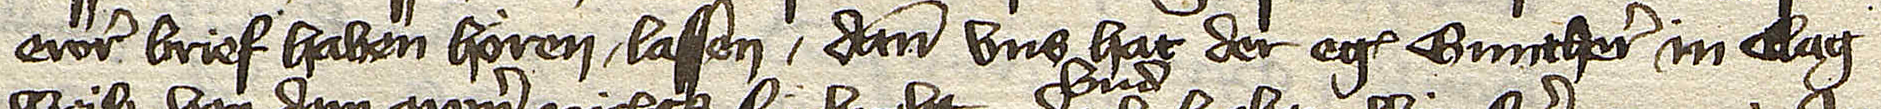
ewr* brief haben hören / laſſen / dan* vns hat der eg* Gunther* in Clag
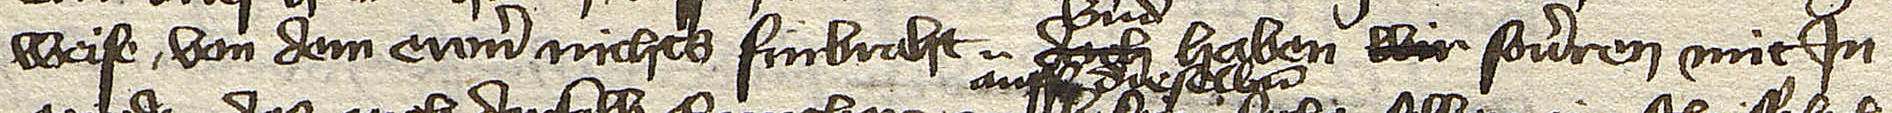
weiſe / von dem ewn* nichts fürbraht ~ doch haben wir ſou*ren mit In
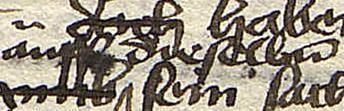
auff dieſelbn*
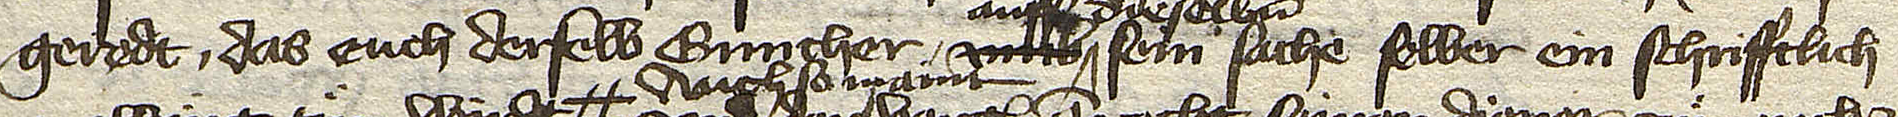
geredt / das euch derſelb Gunther / vmb ſein ſache ſelber ein ſchrifftlich
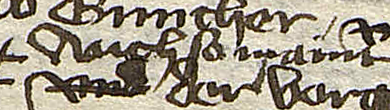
Auch ſo maint
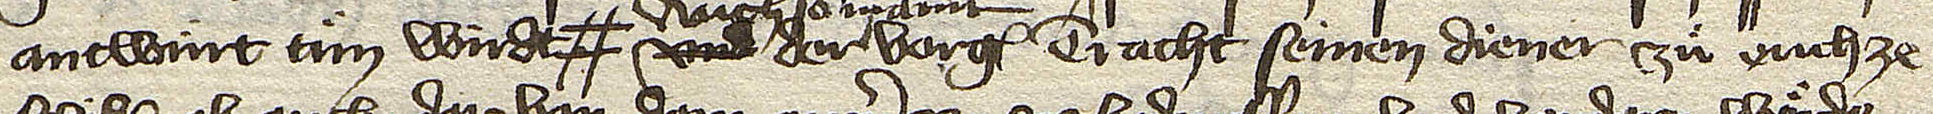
antwürt tün wirdt vnd der vorg* Tracht ſeinen diener cʒü euch ʒe
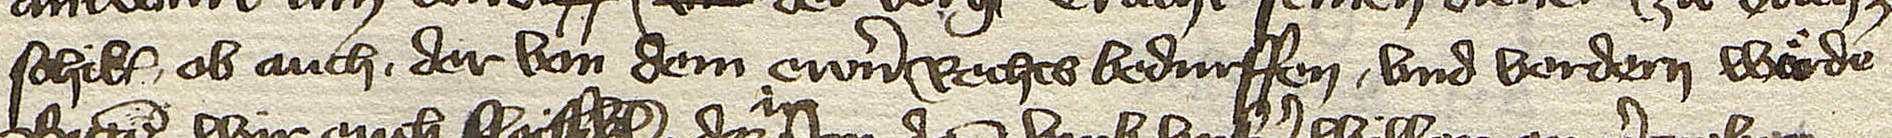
ſchik* ob auch / der von dem ewn* Rechts bedürffen / vnd vordern würde
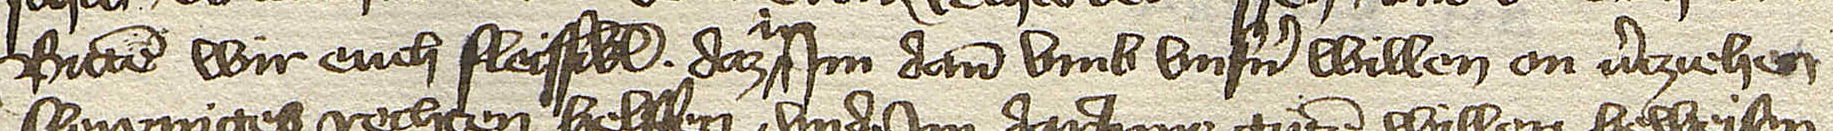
Bitte* wir euch fleiſſikl* . daʒ Im dan* vmb vnſn* willen on u*cʒiehen
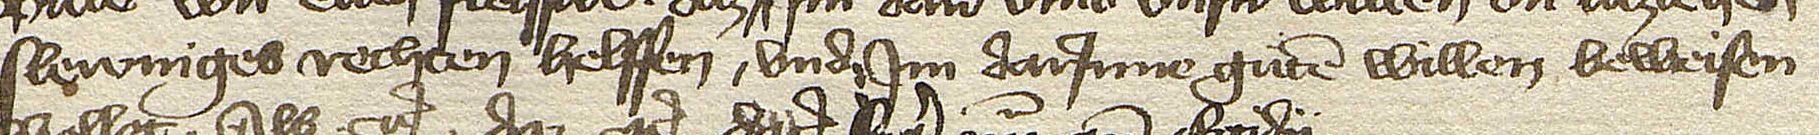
ſlewniges rechten helffen / vnd Im darInne gute* willen beweiſen
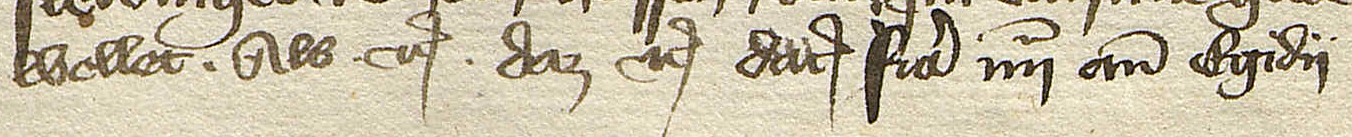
wollet . Als ec* . daʒ ec* dat* fia* iiii* an* Egidii
